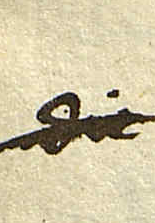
die
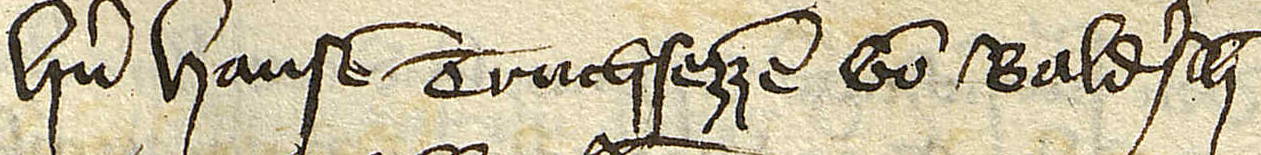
hn* Hanſe* Truchſeʒʒe* vo* Bald*ſh*
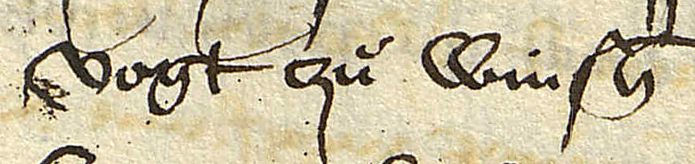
vogt cʒü winſh*
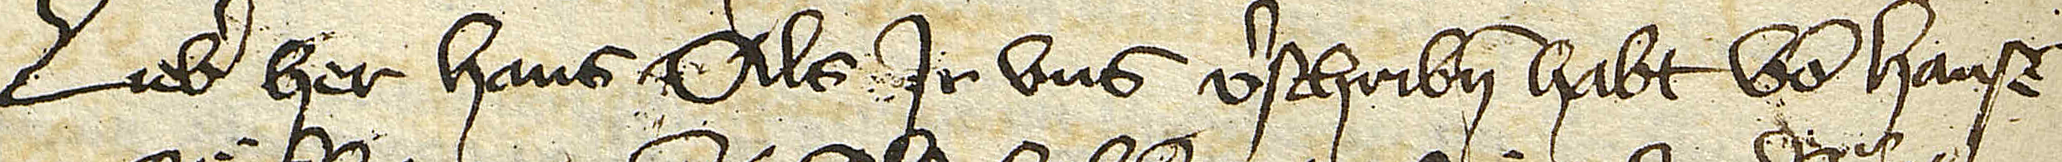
Lieb* her Hans / Als Ir vns v*ſchribn* habt vo* Hanſe*
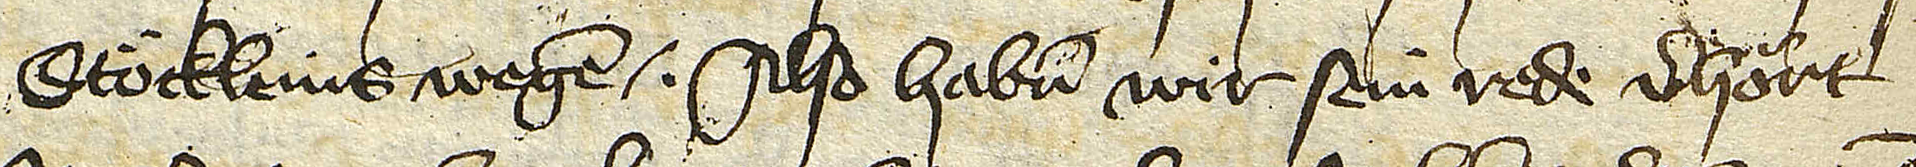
Stöckleins wege* / . Alſo habn* wir ſein rede v*hört
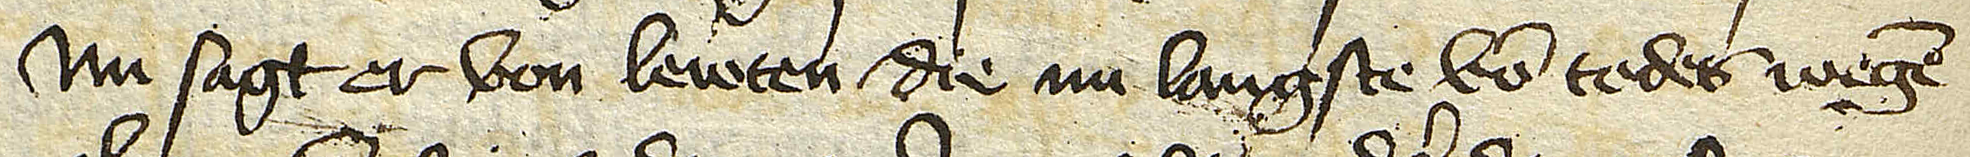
Nu ſagt er von lewtten / die nu langſte vo* todes wege*
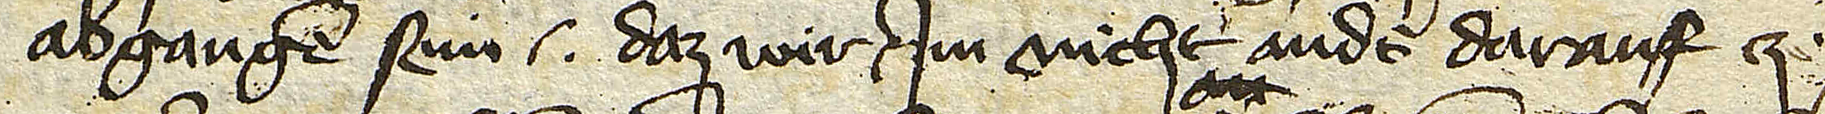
abgange* ſein / . daʒ wir / Im nicht ands* darauff cʒe
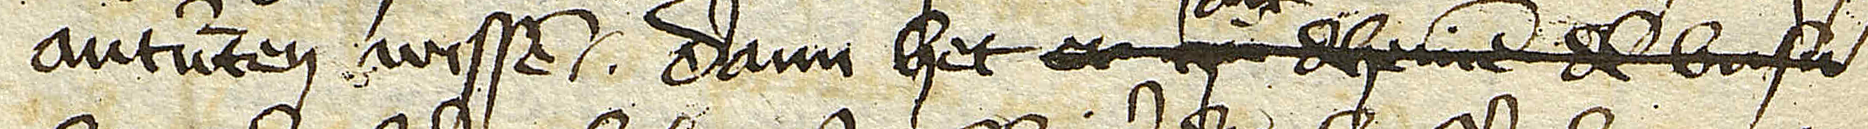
antwten* wiſſe* / . Dann het er cʒü dheine* d* vnſn*
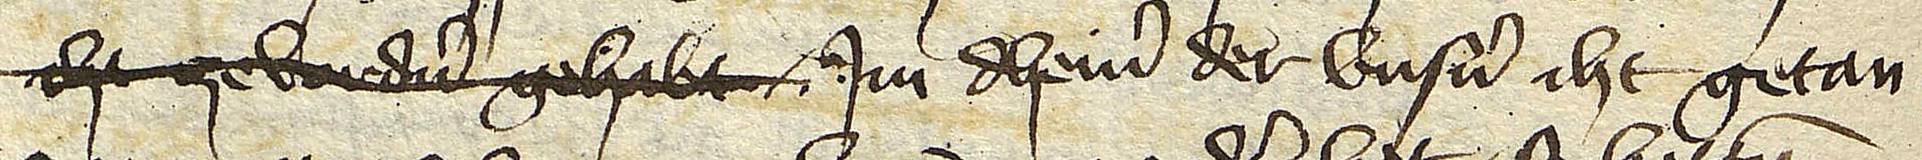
iht cʒevordn* gehabt / . Im dhein* der vnſn* iht getan
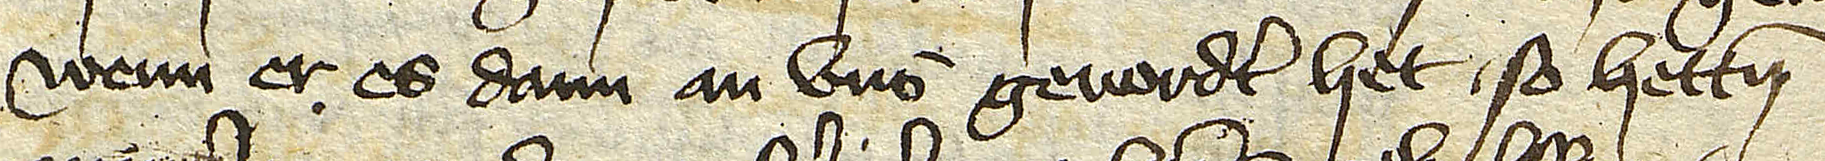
wenn er es dann an vns geuordt* het / ſo hettn*
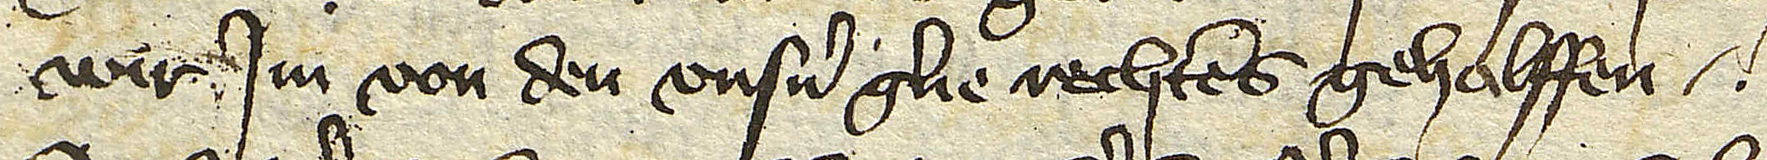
wir Im von den vnſn* g*ne rechte*s geholffen / .
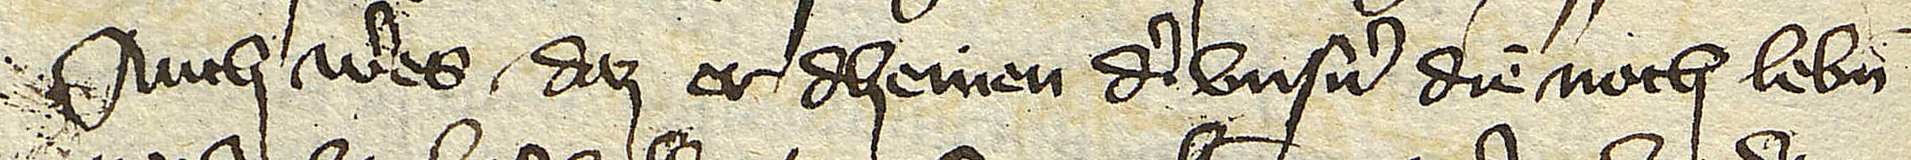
Auch w*es / daʒ er dheinen d* vnſn* die noch lebn*
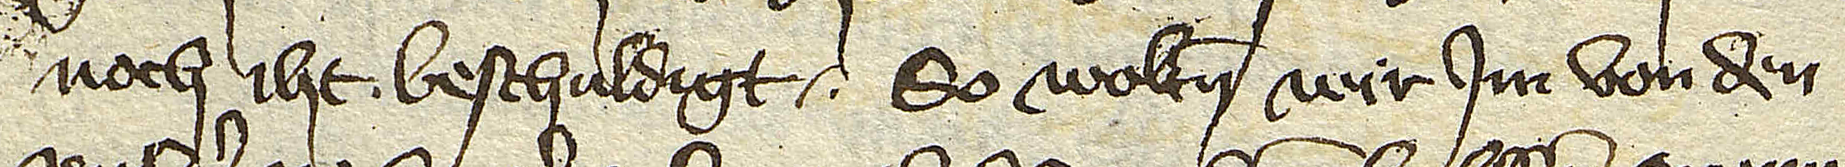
noch iht . beſchuldigt / . So woltn* wir Im von den
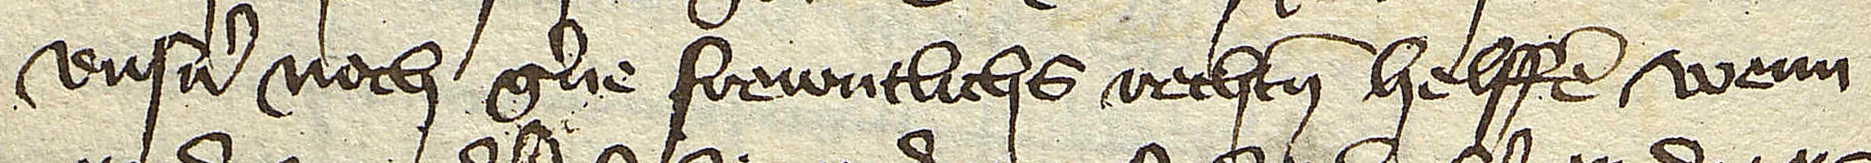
vnſn* noch g*ne frewntlichs rechtn* helffe* / wenn
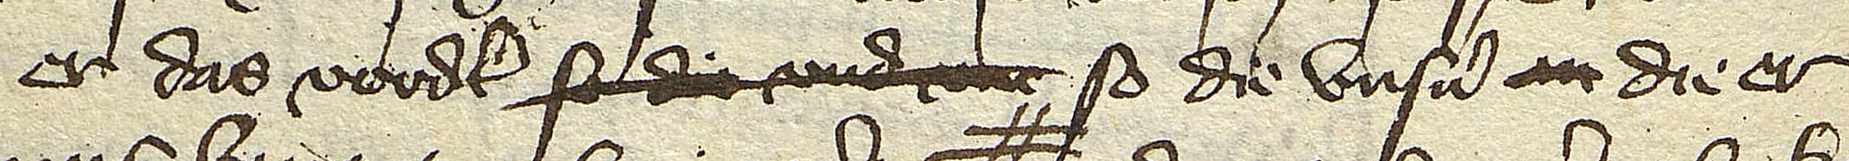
er das vordt* ſo die vnd wir ſo die vnſn* an die er
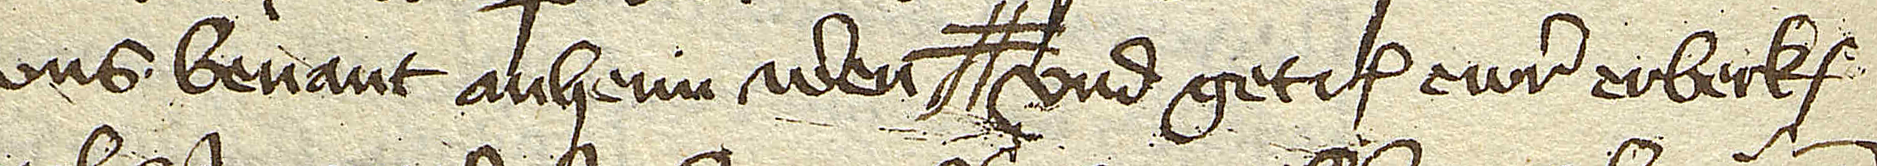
vns benant anheim w*en / vnd getr* ewr* erberk*
